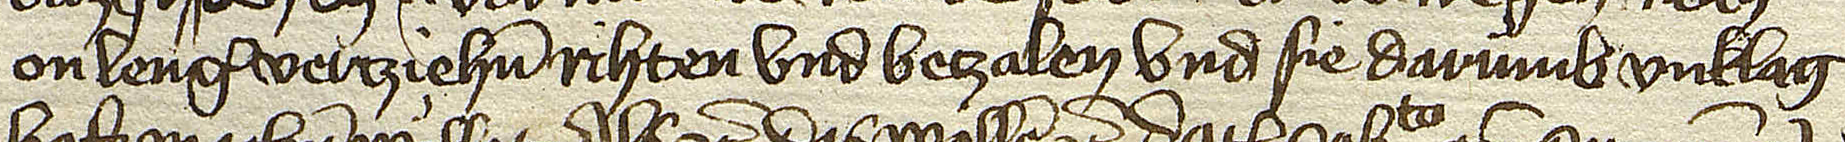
on leng* vercʒieh*n rihten vnd becʒalen vnd ſie darümb vnklag
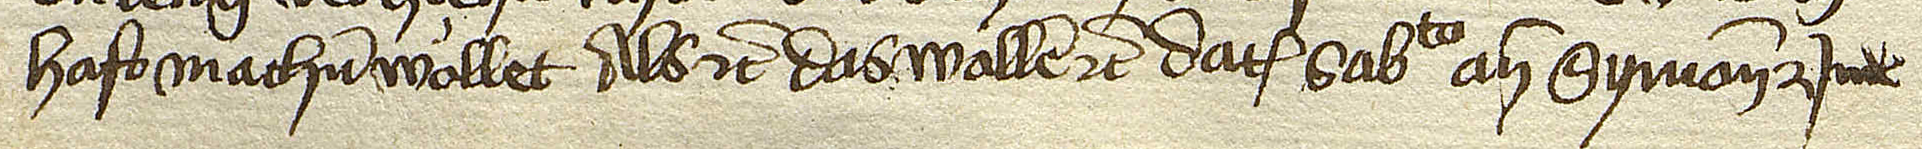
haft mach*n wöllet Als ec* das wölle* ec* dat* Sab* an* Symon* @ Iude
